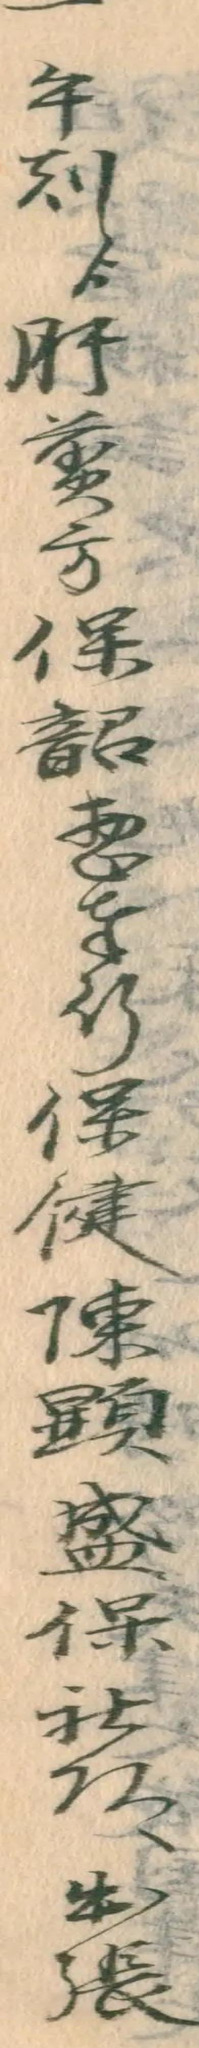一午刻ゟ肝煎方保韶惣奉行保健陳顕盛保社頭へ出張
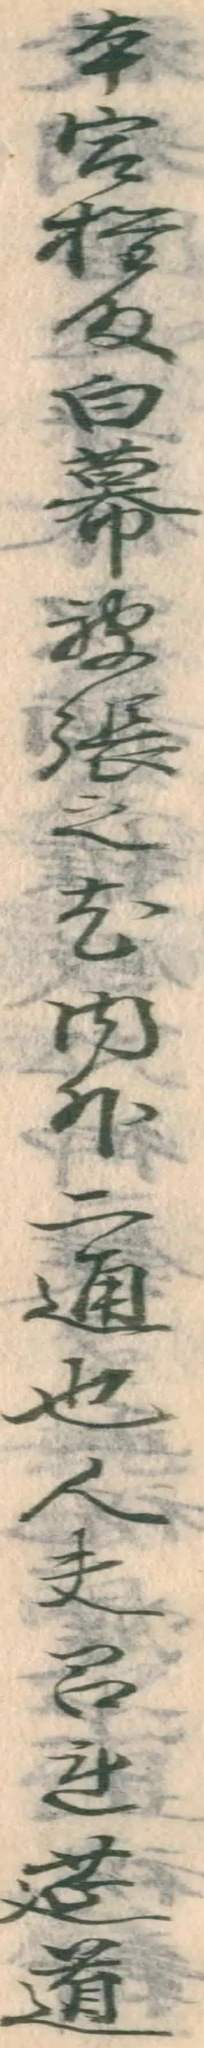本宮権殿白幕被張之尤内外二通也人夫召連莚道
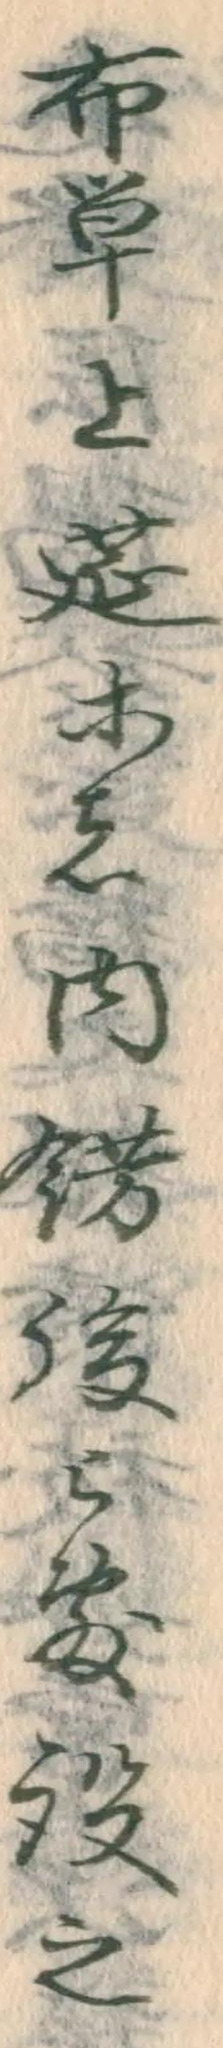布単上莚等は内錺後被敷設之
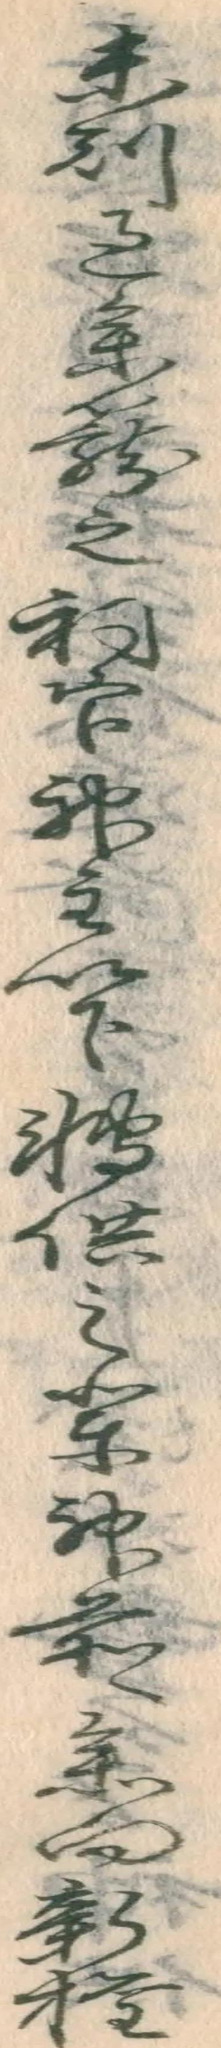一未刻過参籠之祠官神主以下転供之輩神前へ参向新権
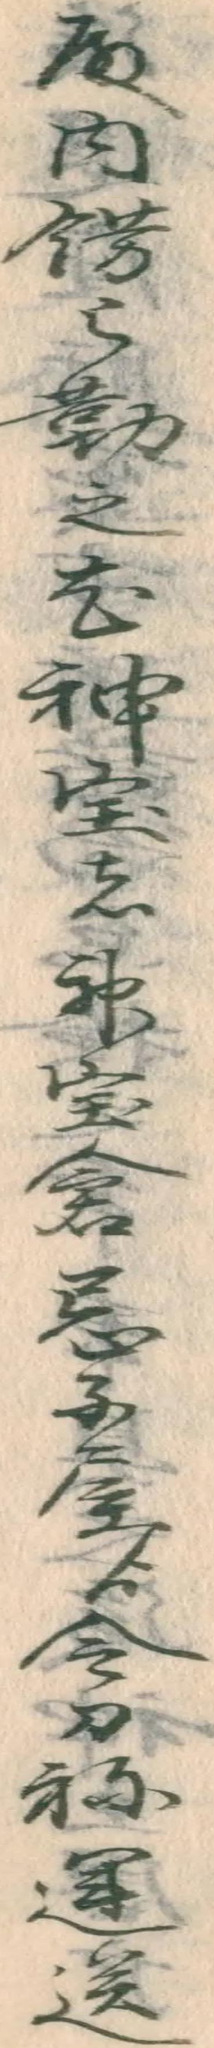殿内錺之勤之尤神宝は神宝倉忌子屋ゟ令刀祢運送
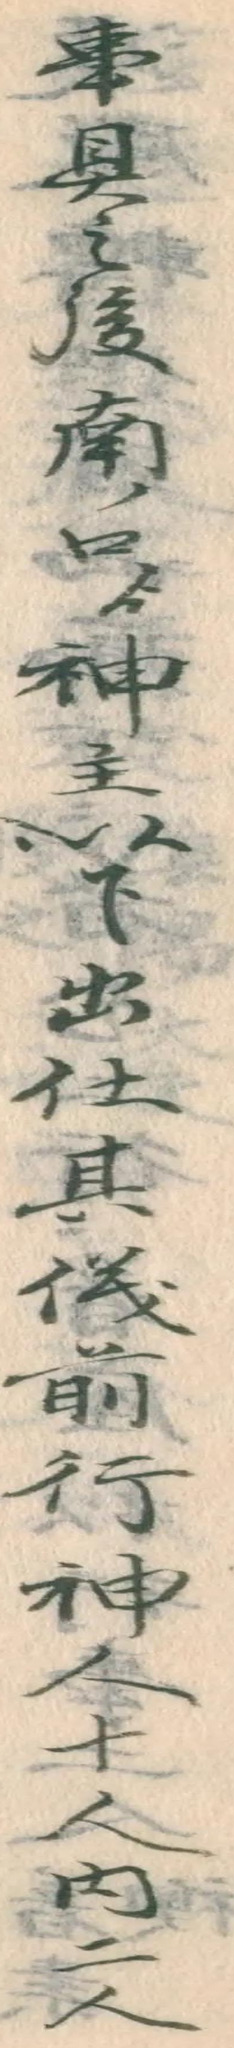事具之後南ノ口ゟ神主以下出仕其儀前行神人十人内二人
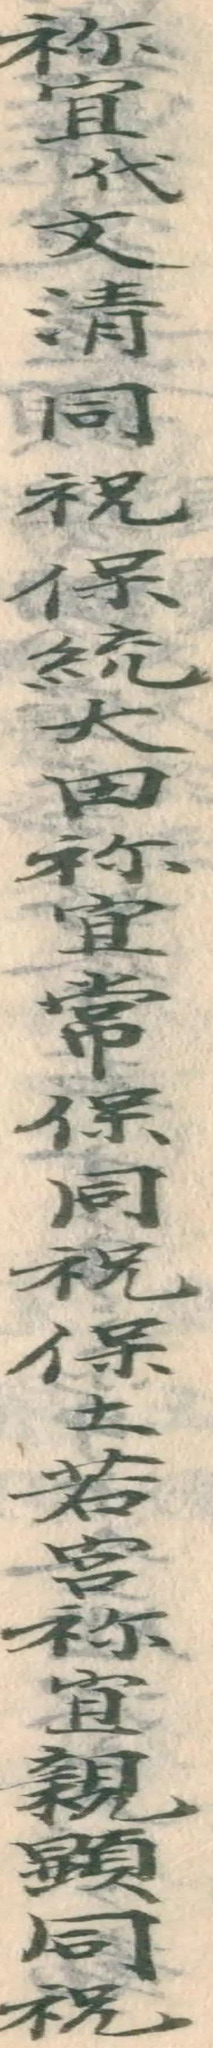祢宜代文清同祝保統大田祢宜常保同税保土若宮祢宜親顕同祝
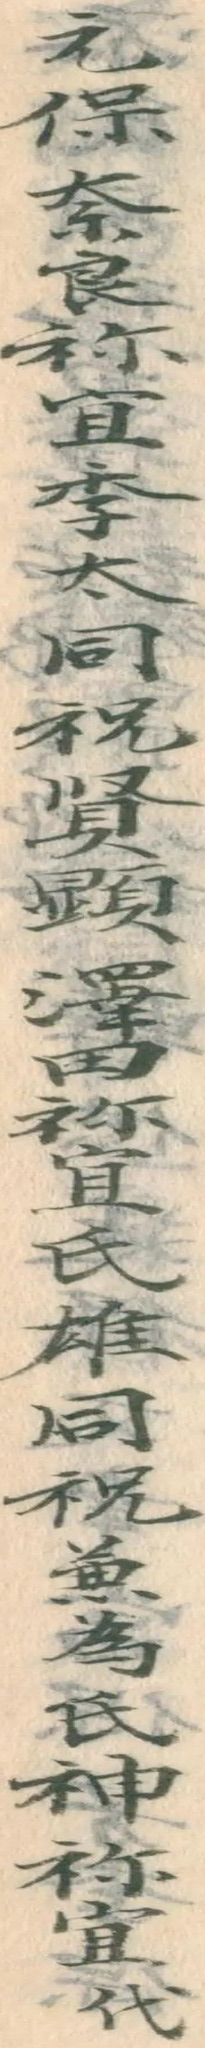元保奈良祢宜季太同祝賢顕沢田祢宜氏雄同祝兼為氏神祢宜代

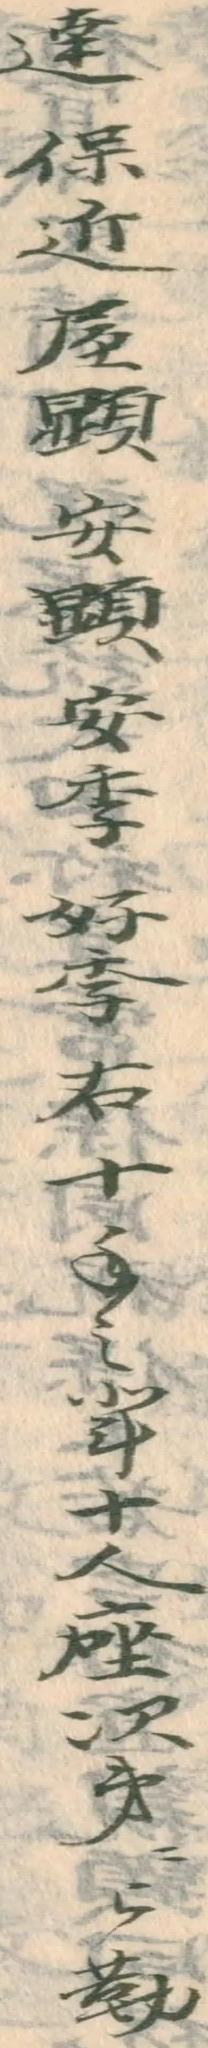達保近屋顕安顕安季好季右十手之輩十人座次第ニ被勤
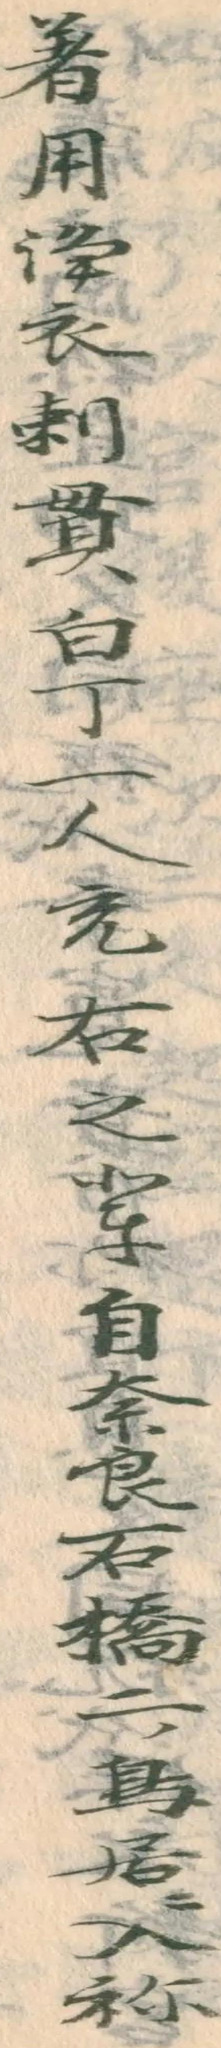着用浄衣刺貫白丁一人充右之輩自奈良石橋二ノ鳥居ニ入祢
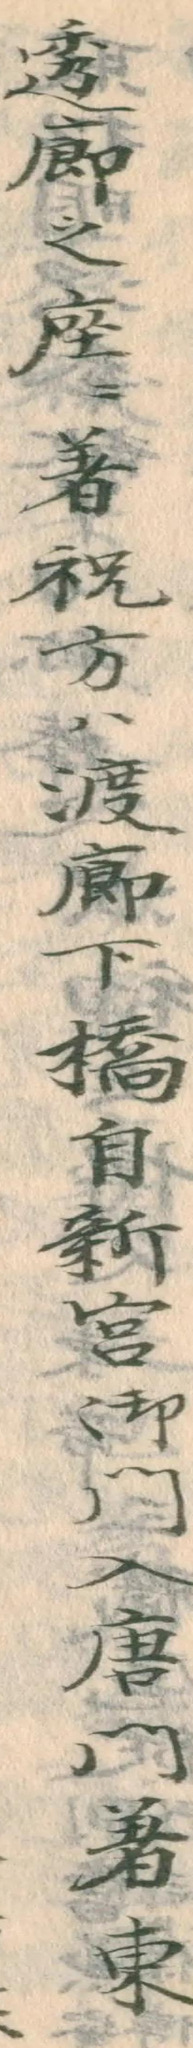透廊之座ニ着祝方ハ渡廊下橋自新宮御門入唐門着東
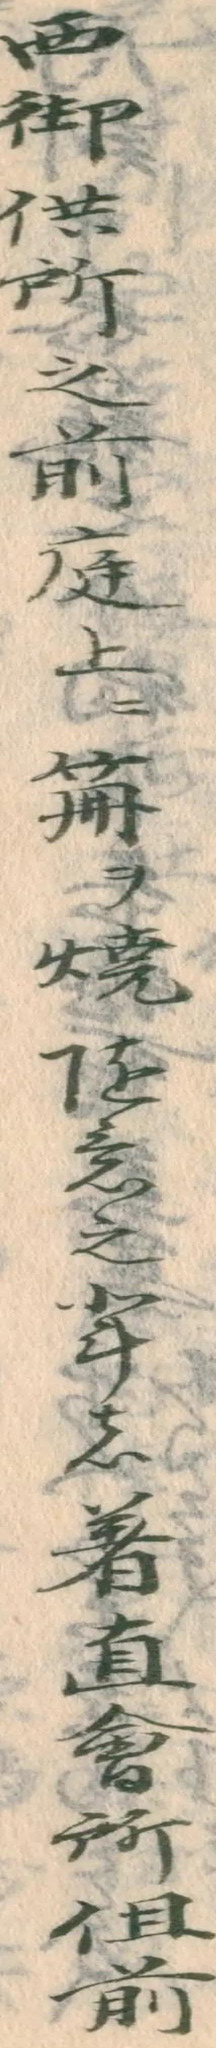西御供所之前庭上ニ笧ヲ焼随意之輩は着直会所但前
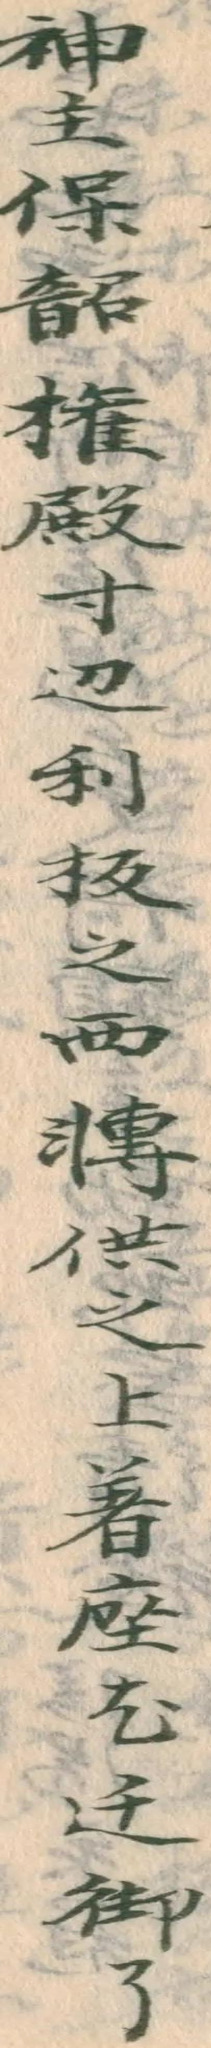神主保韶権殿寸辺利板之西転供之上着座尤迁御了
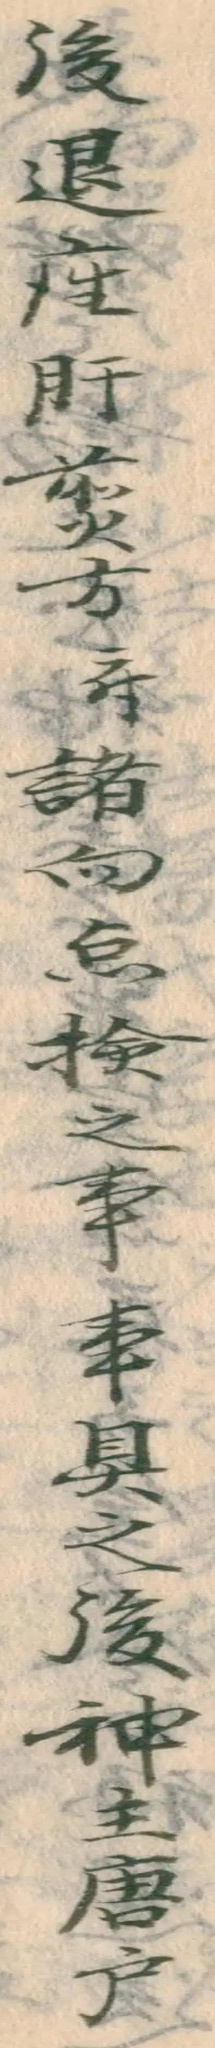後退座肝煎方ニ付諸向点検之事事具之後神主唐戸
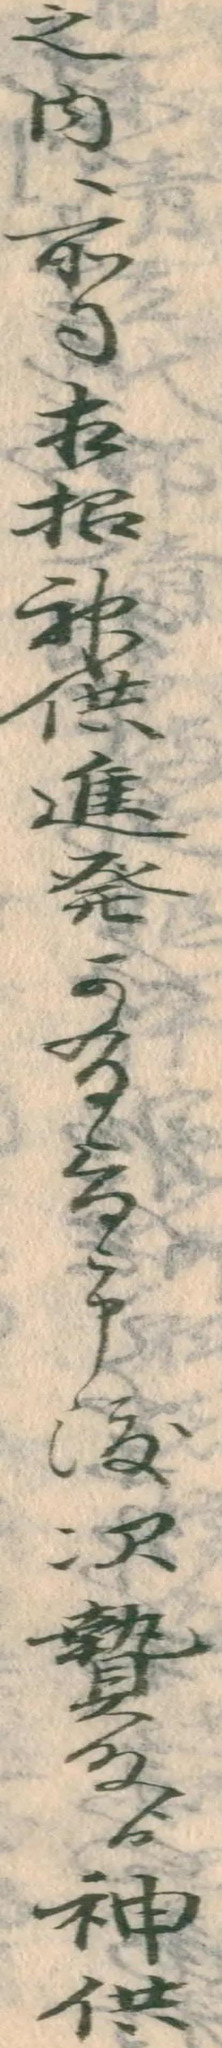之内へ所司相招神供進発可有旨被申渡次贄殿ゟ神供
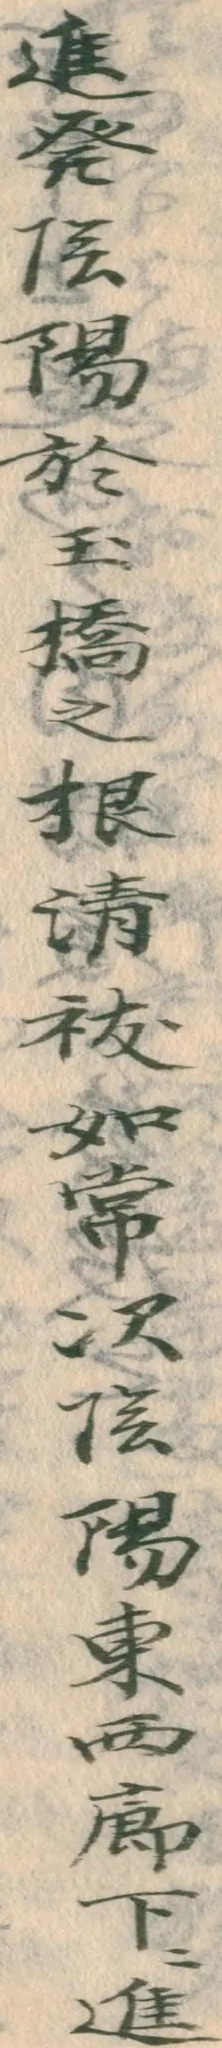進発陰陽於玉橋之根清祓如常次陰陽東西廊下ニ進
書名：賀茂社記録. 第17冊
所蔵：国立国会図書館 National Diet Library, JAPAN
